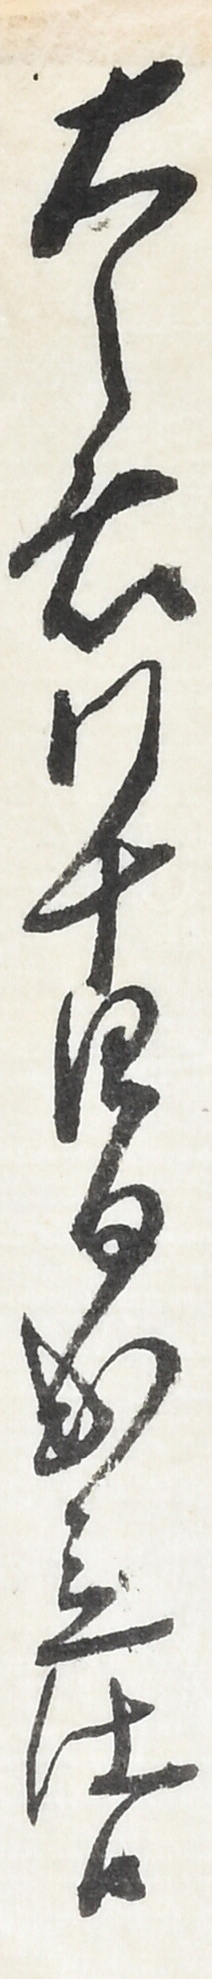右之者同十四日出立仕候

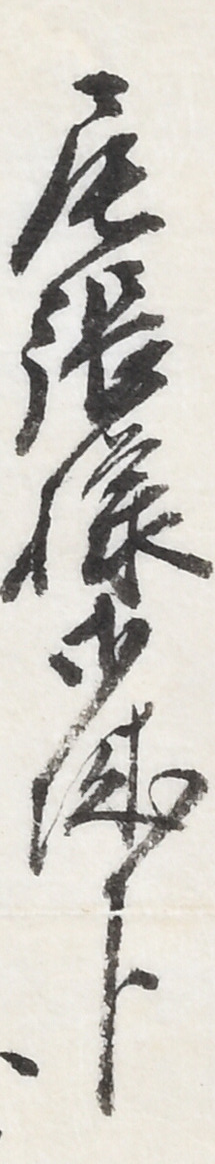尾張様御城下
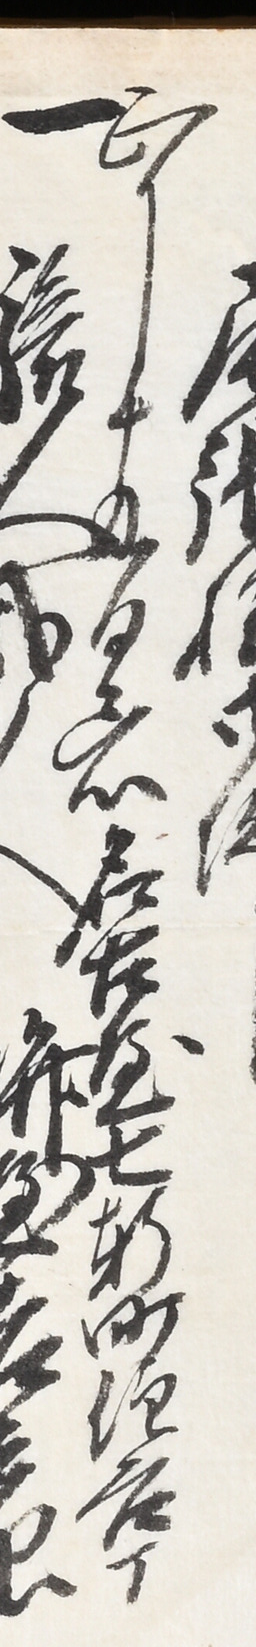正月十九日着名古屋七軒町住吉丁
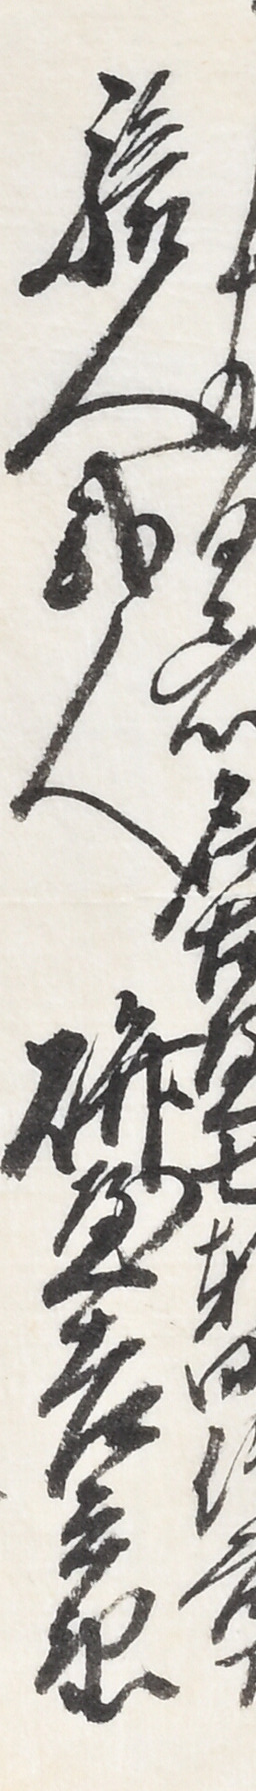一旅人弐人研屋吉兵衛
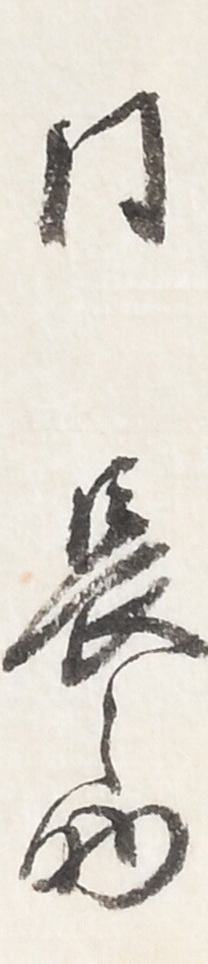同長之助
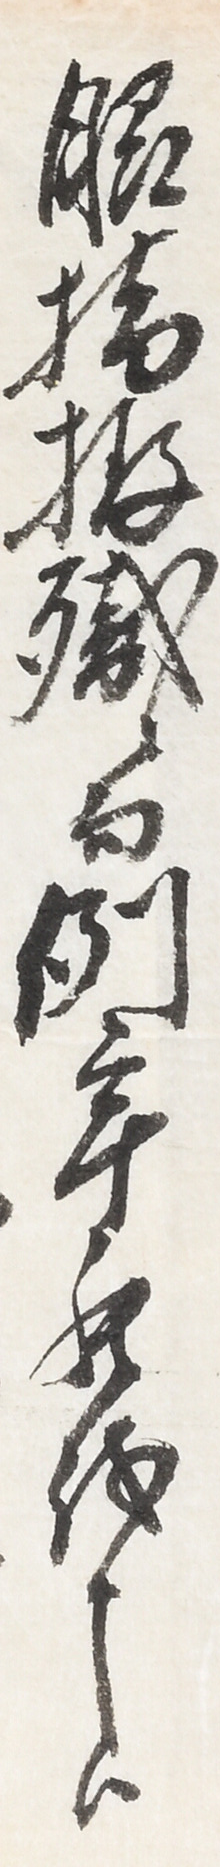脇指拵職ニ而例年罷越申候
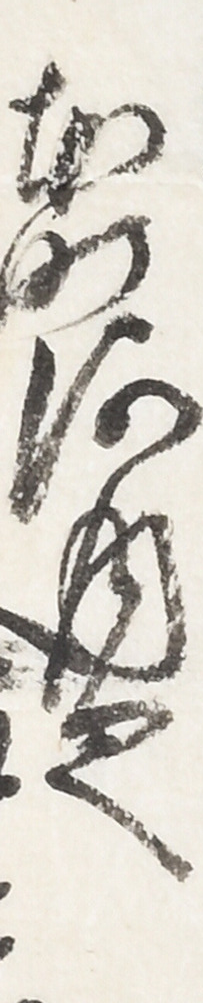本町河内や
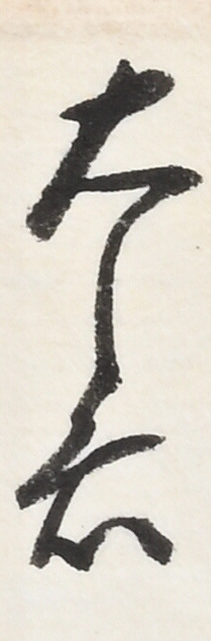右之者
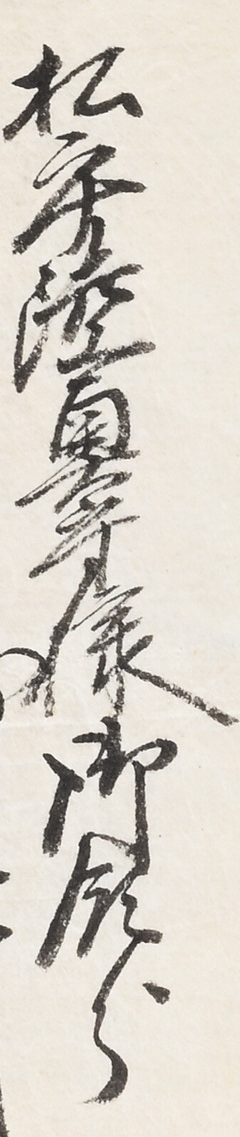松平陸奥守様御領分
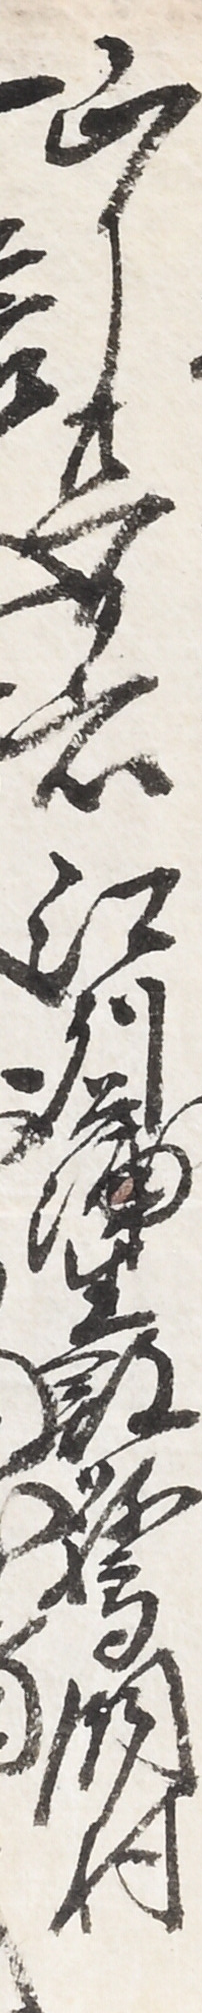正月廿一日着江州蒲生郡鷹飼村
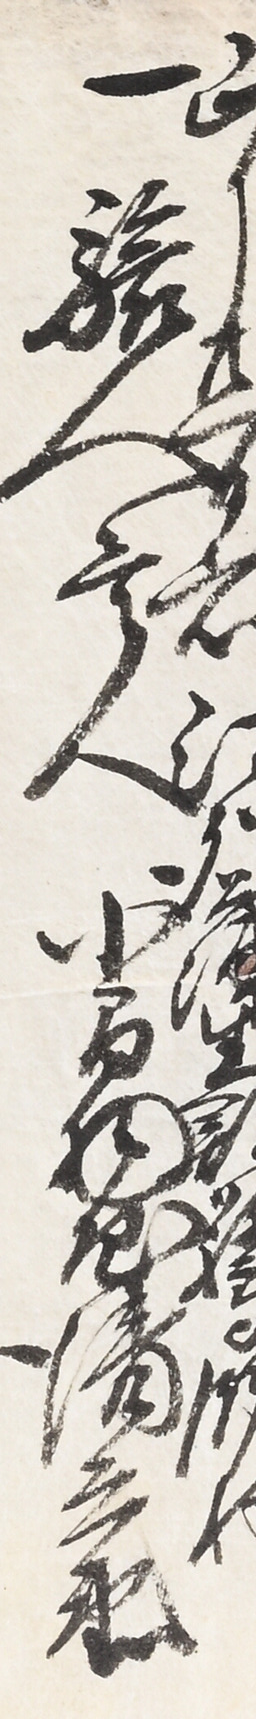一旅人壱人小間物屋清兵衛
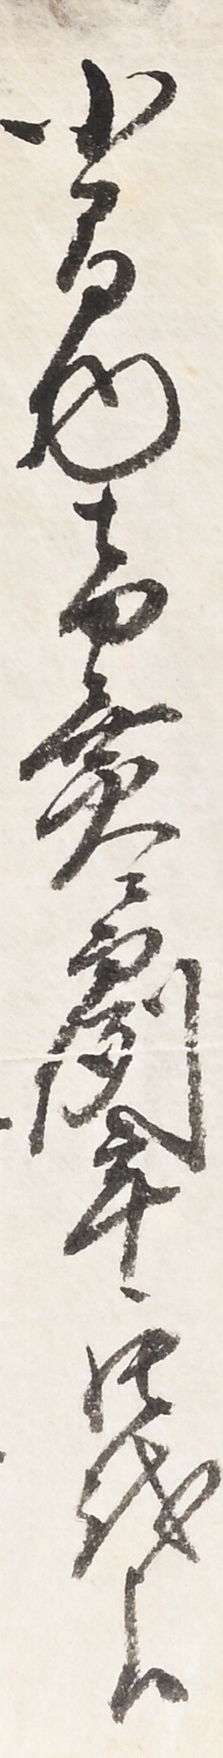小間物商売ニ而例年罷越申候
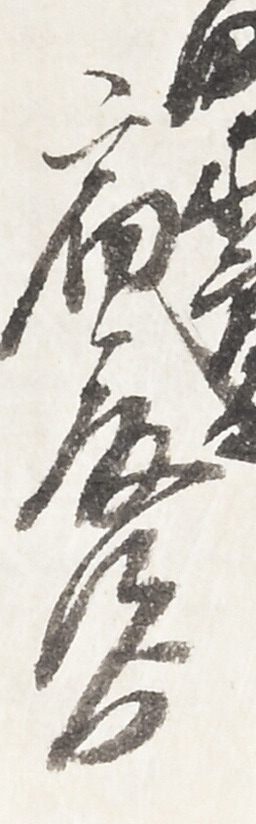宿藤左衛門
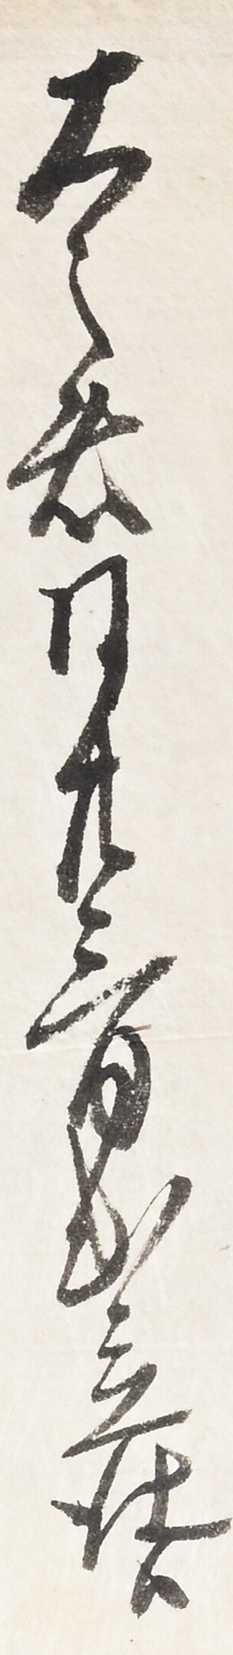右之者同廿三日出立仕候
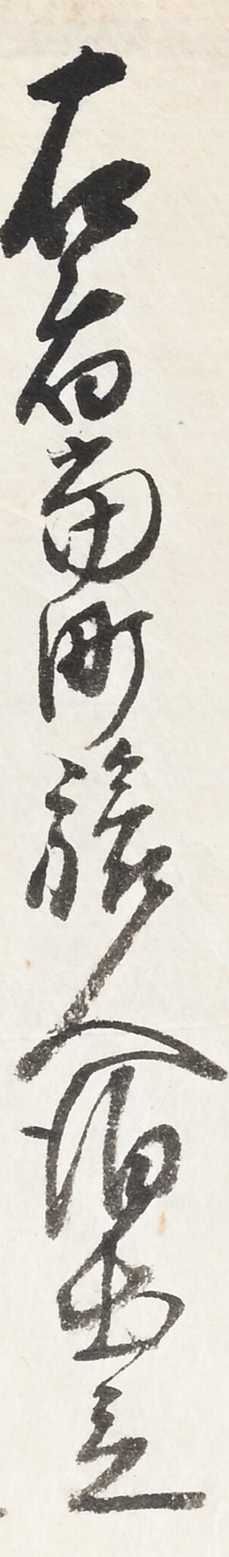右者当町旅人泊出立
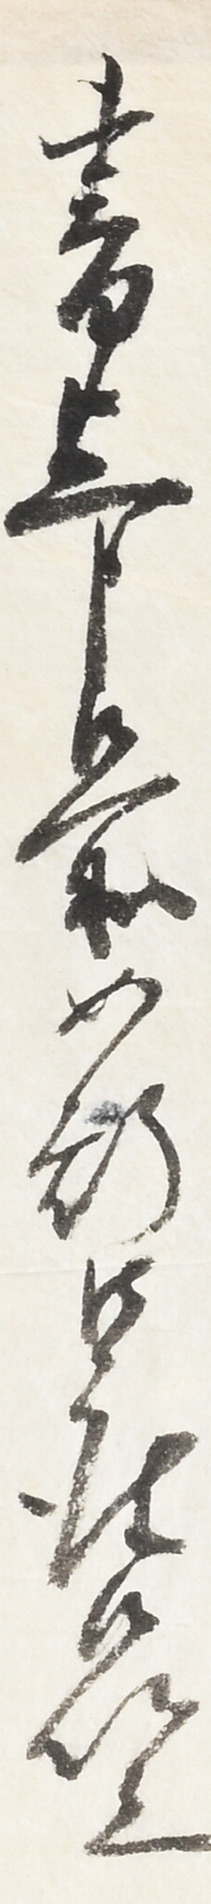書上申候所如斯御座候以上
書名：旅人泊控帳
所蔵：伊那市立高遠町図書館・合同会社AMANE
